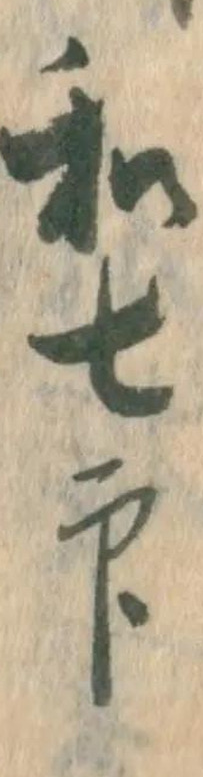和七印
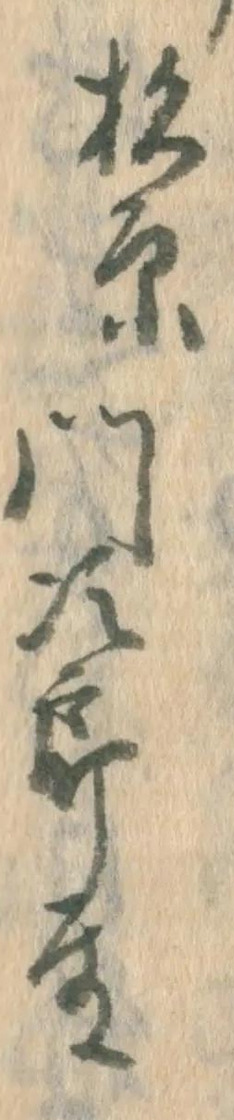杉原門次郎殿

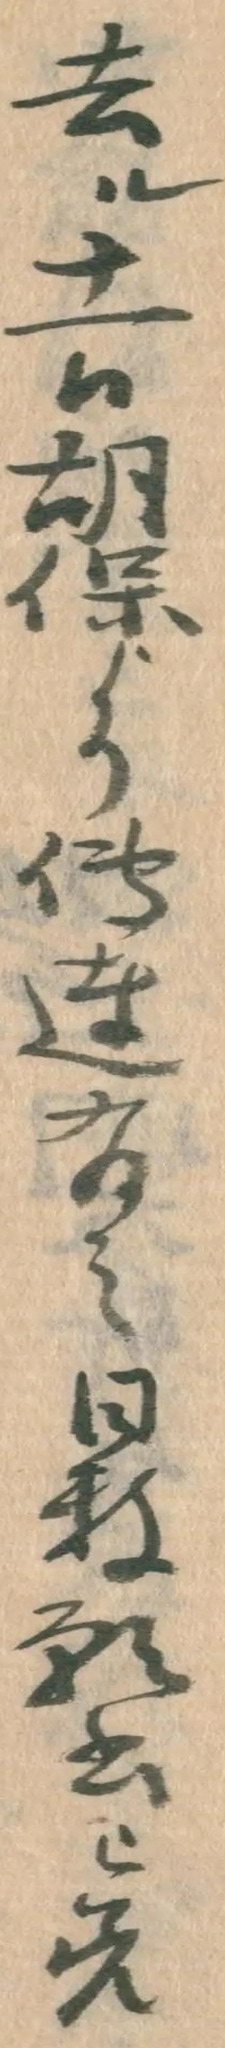去ル十一日、胡保より傳達有之、日数願書被差
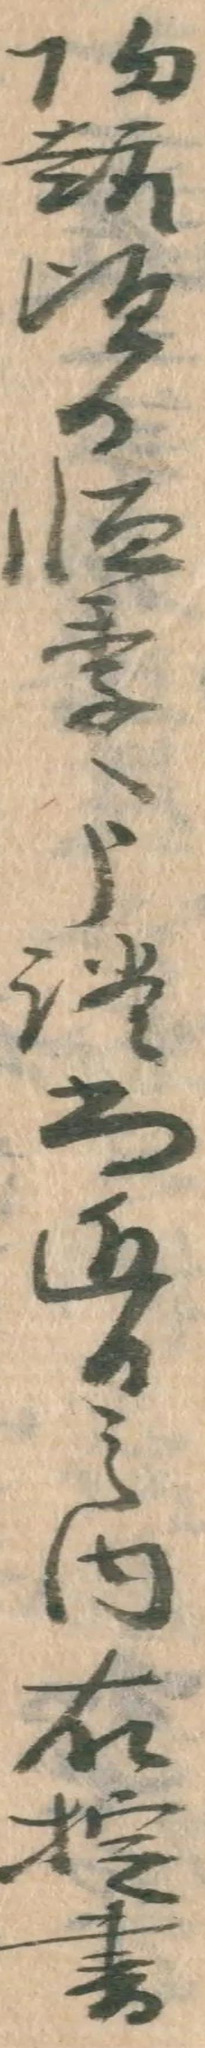帰趣、頃日恒季へ申談、尚近日之内右掟書
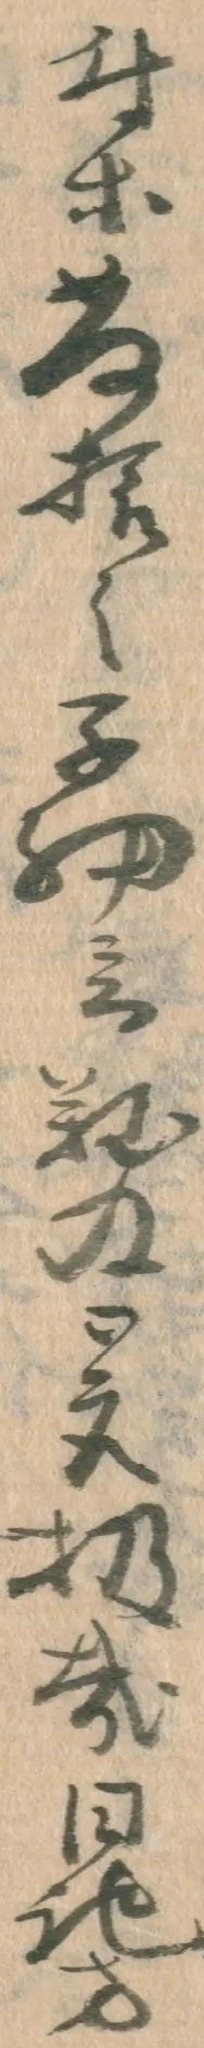付等如何様之子細ニ而難及御取扱哉、日記方
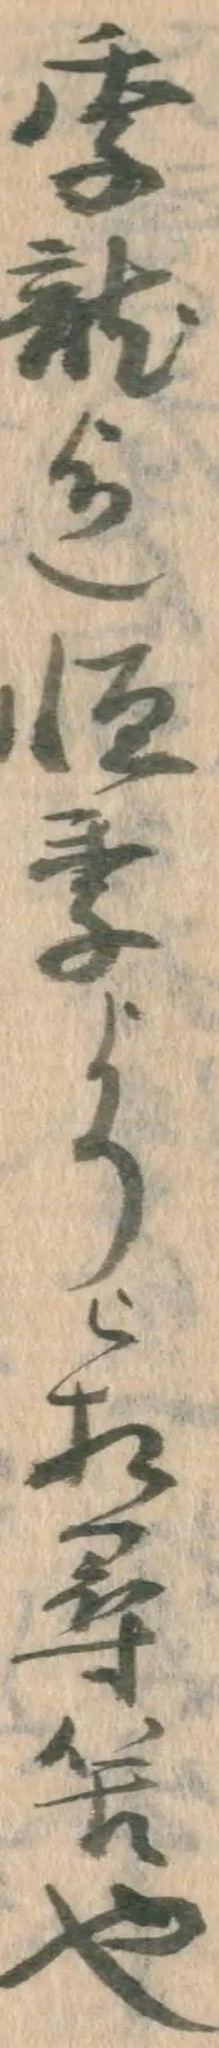季龍迄恒季より被相尋筈也、
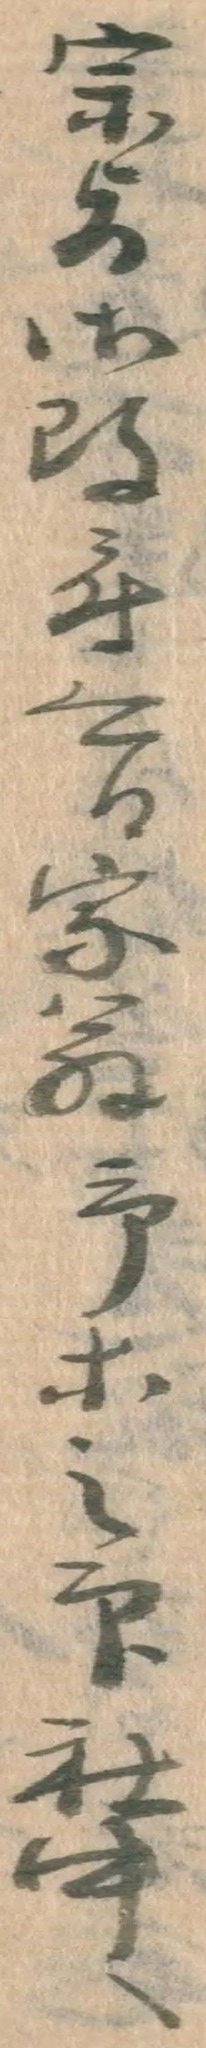宗旨御改ニ付、今日宗翁・予等之印、社中へ
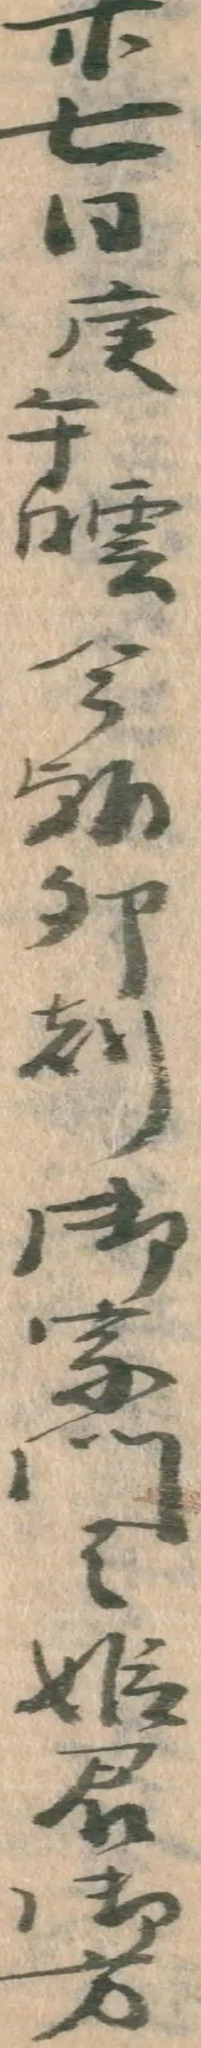廿七日庚午曇、今朝卯刻御家門者姫君御方
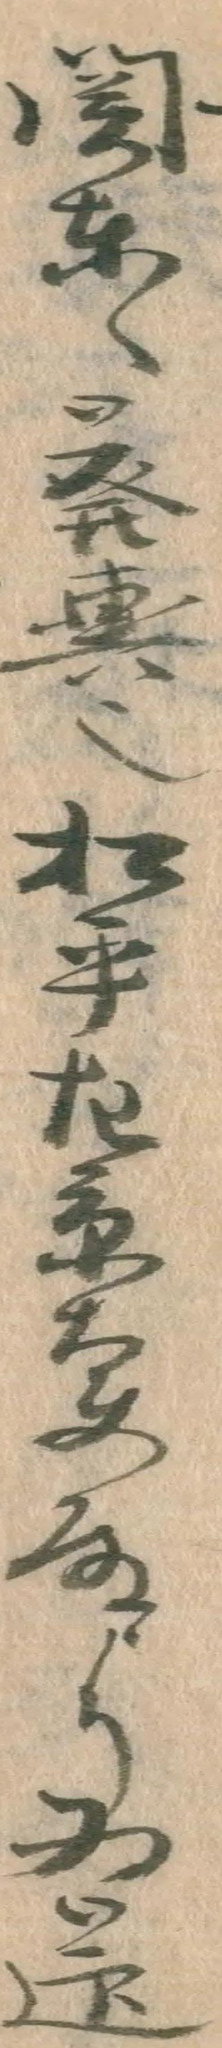関東へ御発輿也、松平左京大夫殿より為御迎、
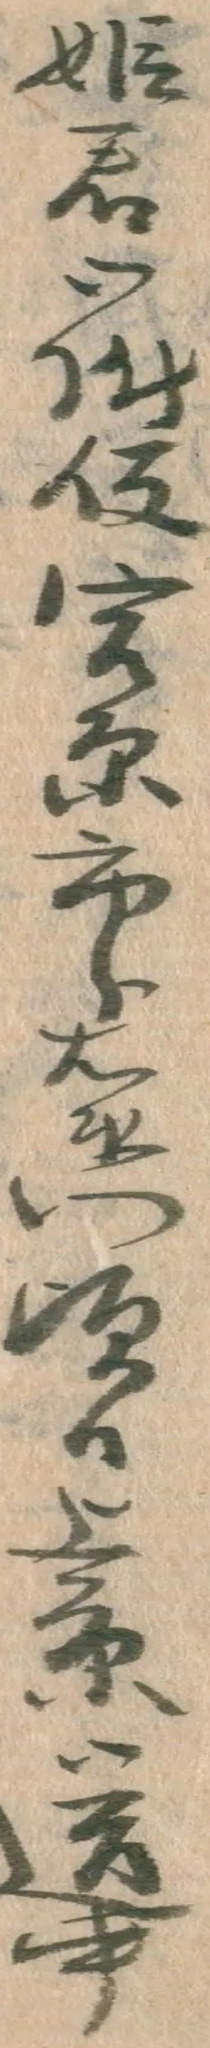姫君御附仮宮原市郎右衛門頃候、上京御道中
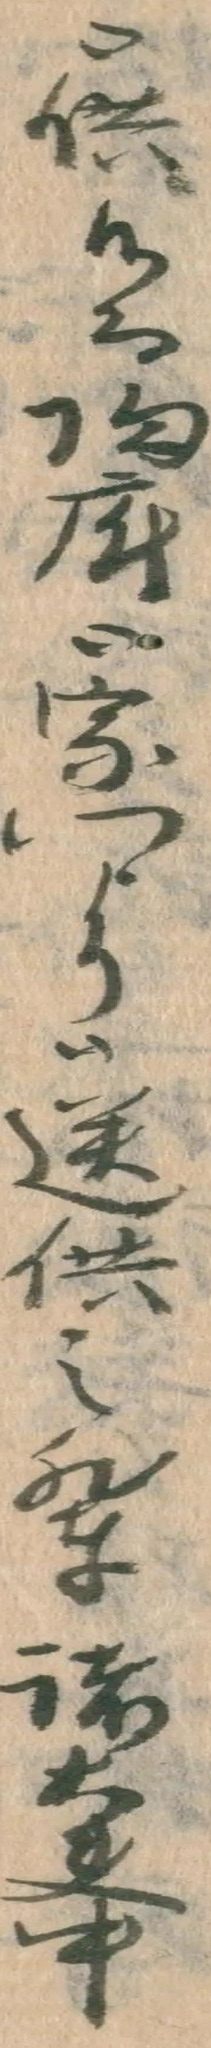御供候而、帰府御家門より御送供之輩、諸大夫中
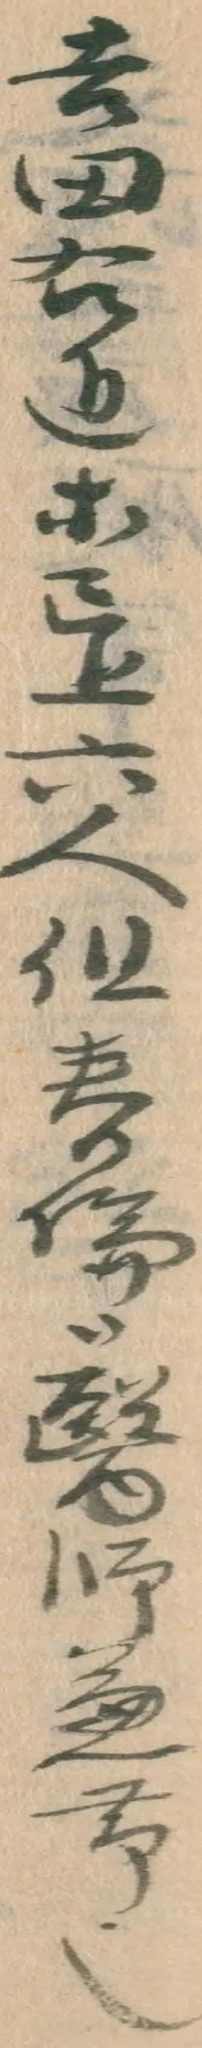吉田右近等已上六人、但春輪ハ醫師兼帯也、
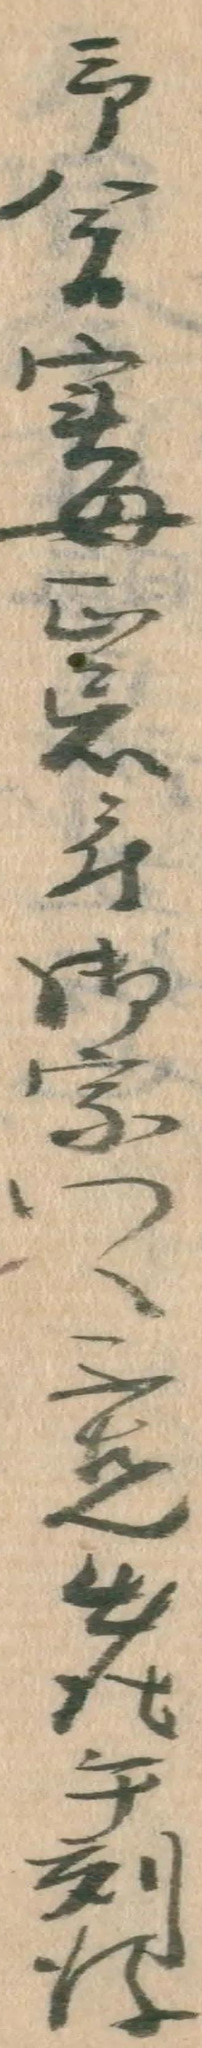予、今日実母正忌に付、御家門へ不罷出候、午刻後
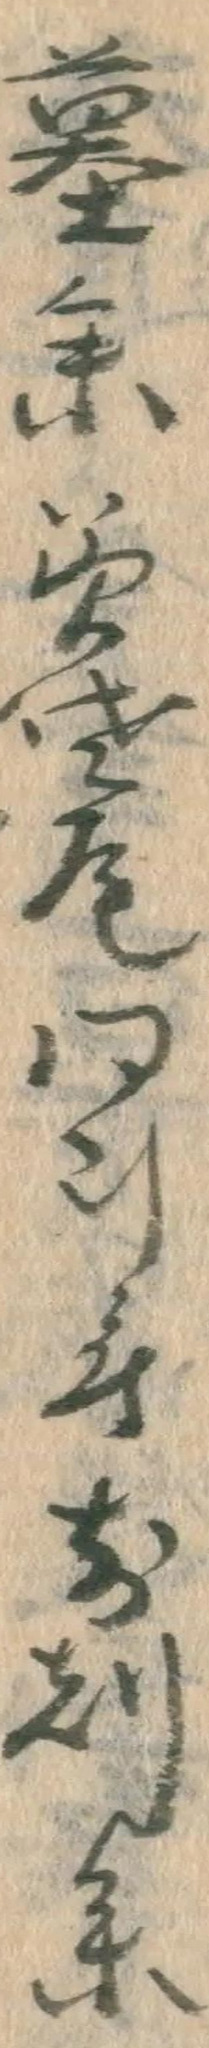墓参、曽袋尾同断ニ付前刻参
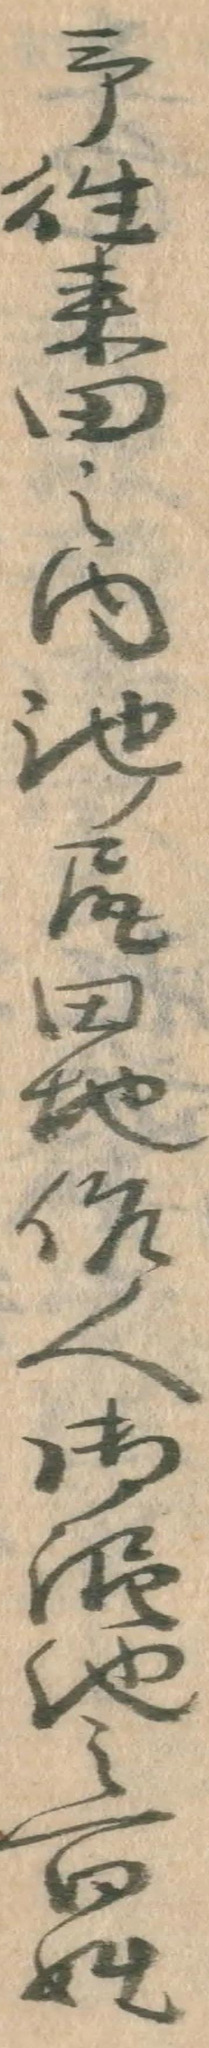予、往来田之内、池ノ尻田地作人・御泥池之百姓
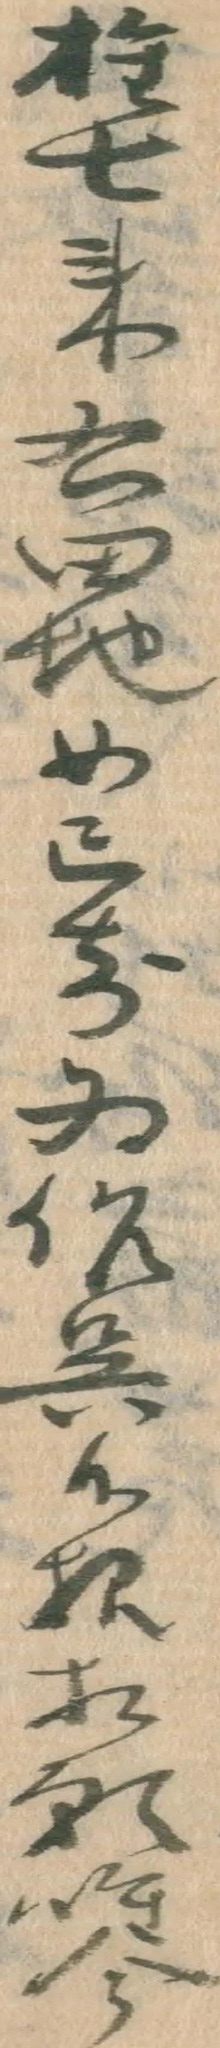権七来、右田地、如已前為作呉候様相願、昨今
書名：賀茂社記録. 第63冊
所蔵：国立国会図書館 National Diet Library, JAPAN
